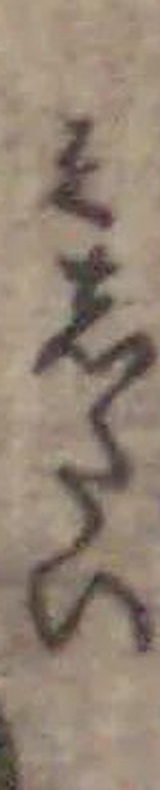みしたい

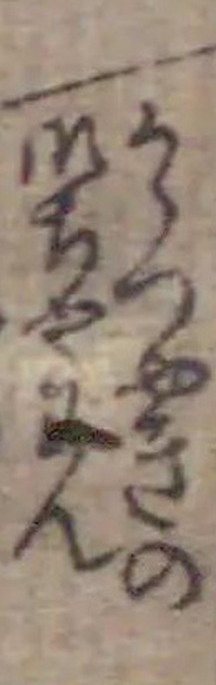御ちやわん
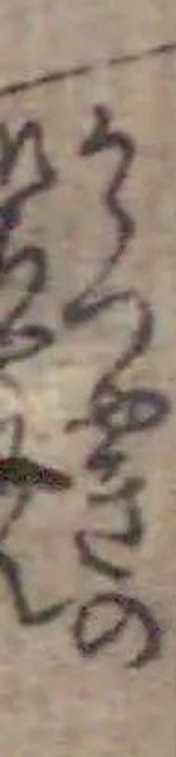からつやきの
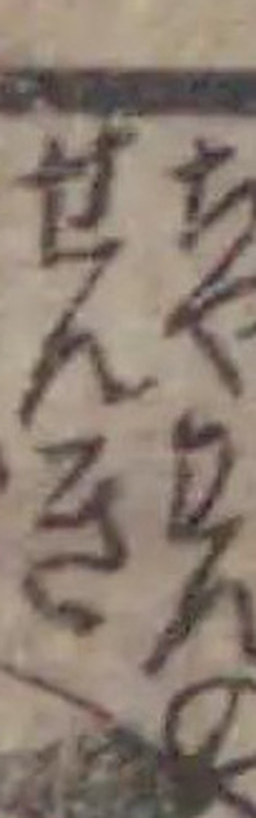せんき
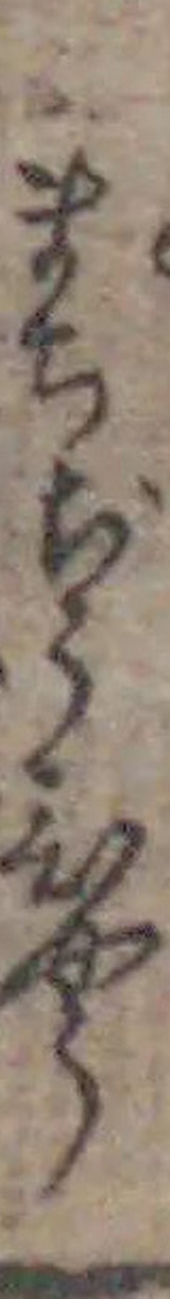まちぢうひやう
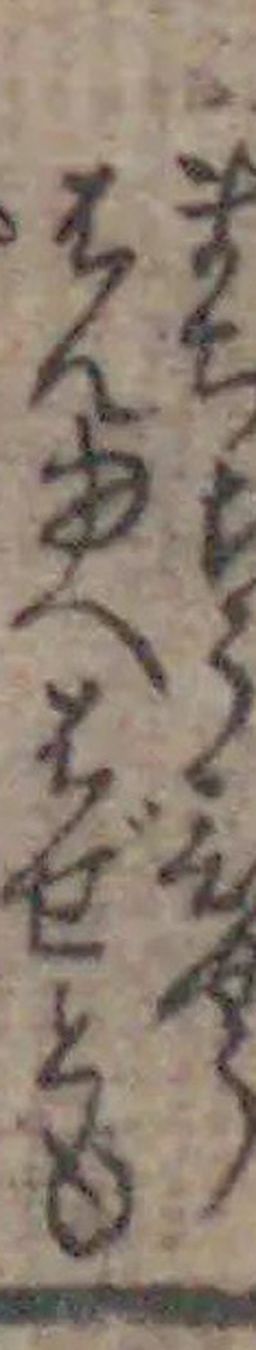はんゆへはぜとも
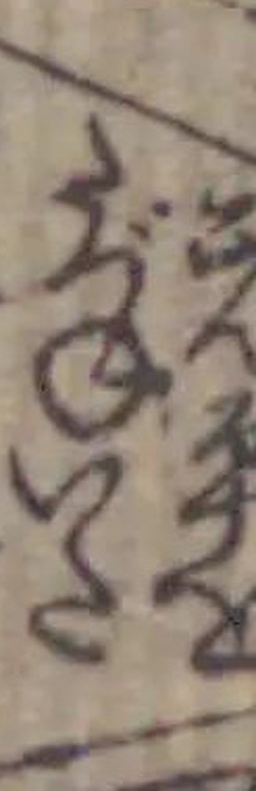たづねいた
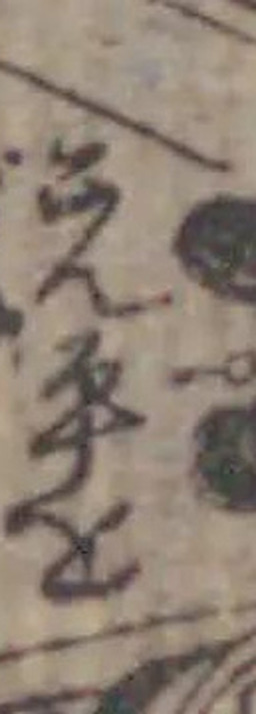こん平を
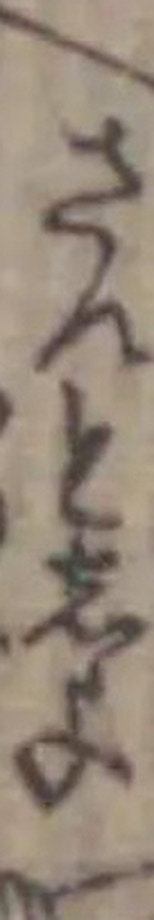さんとしよ
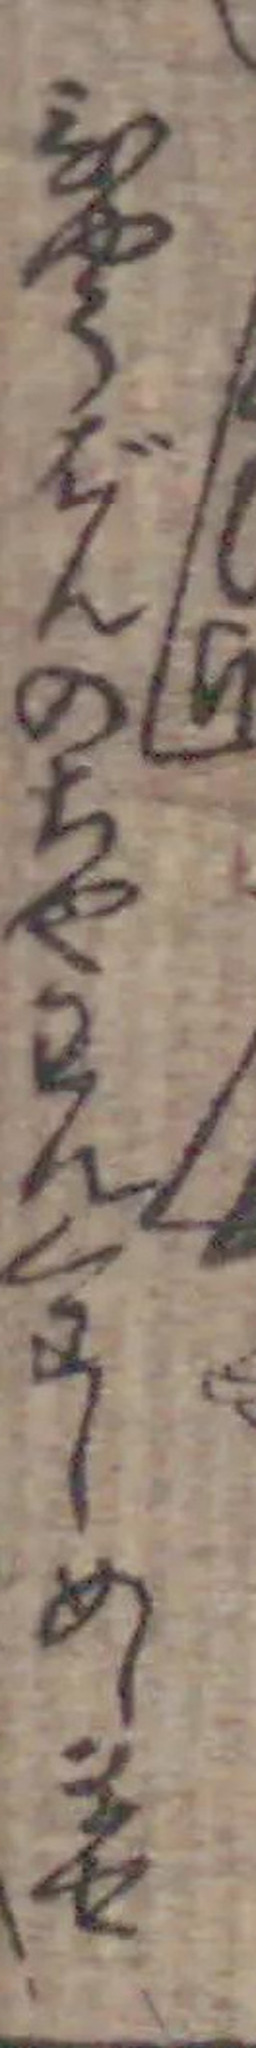ひやうばんのちやわんくわしめしませ〳〵
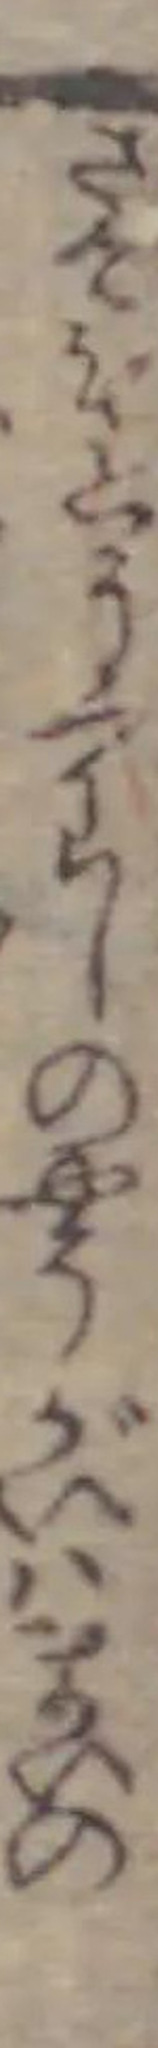さてとうくわしのやうがいはまいの
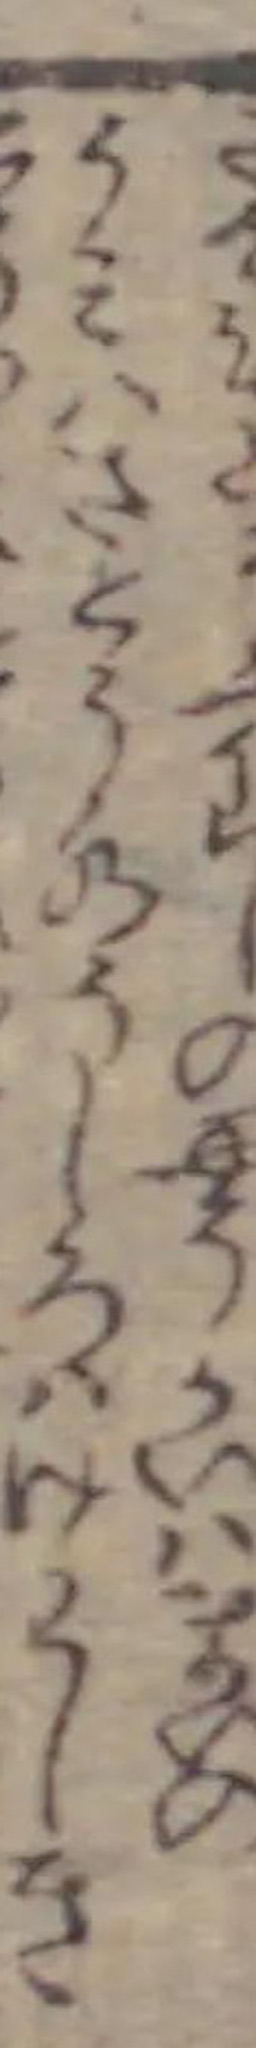うみはさとうのうしろはけわしき
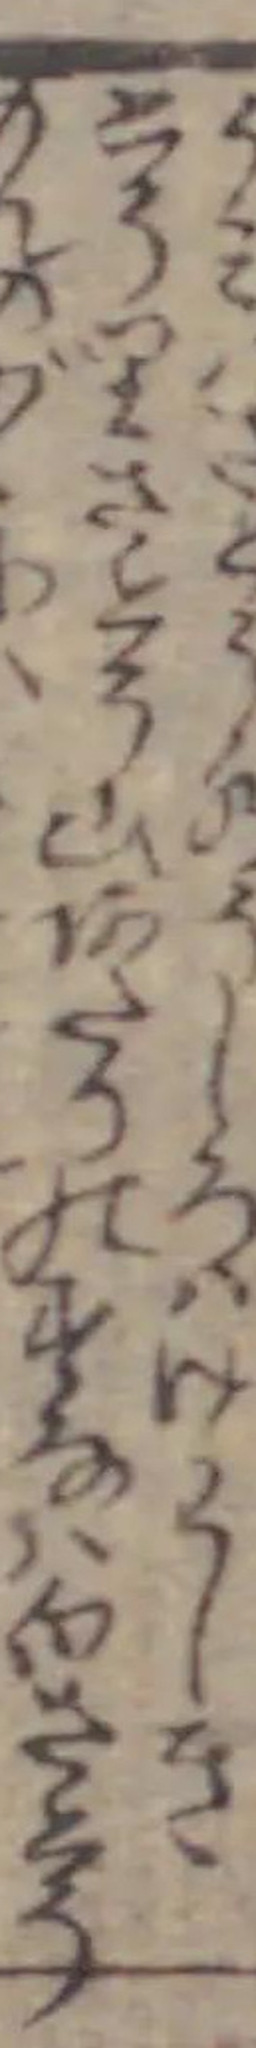とうりさとう山あたりのすなは白さとう
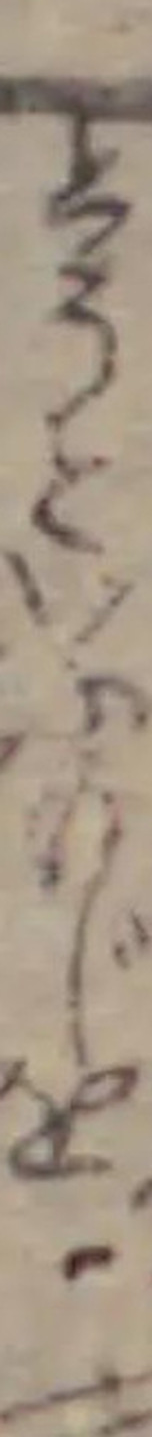とうといふもじを
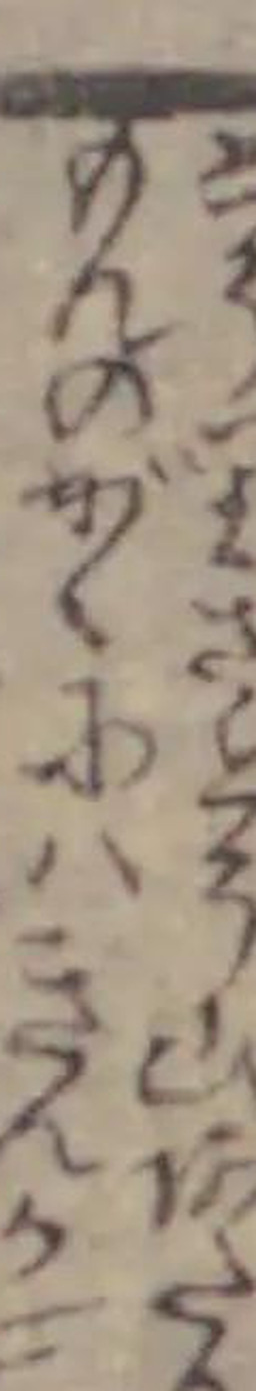もんのがくにはきんか
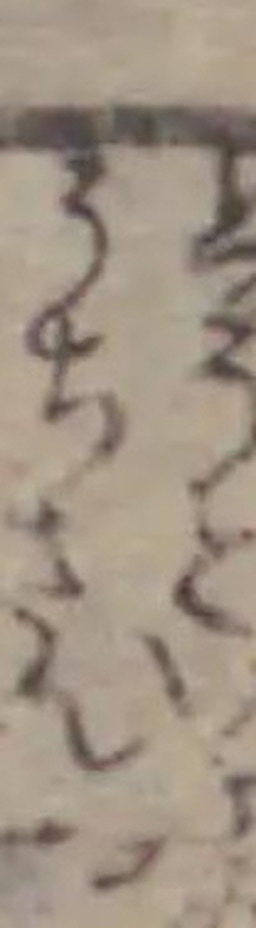うちさん
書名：名代干菓子山殿 3巻
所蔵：国立国会図書館 National Diet Library, JAPAN
